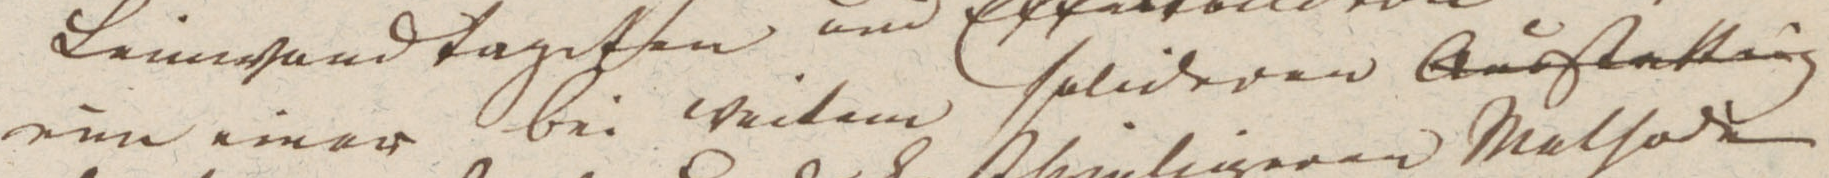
nun einer bei weitem solideren Ausstattung
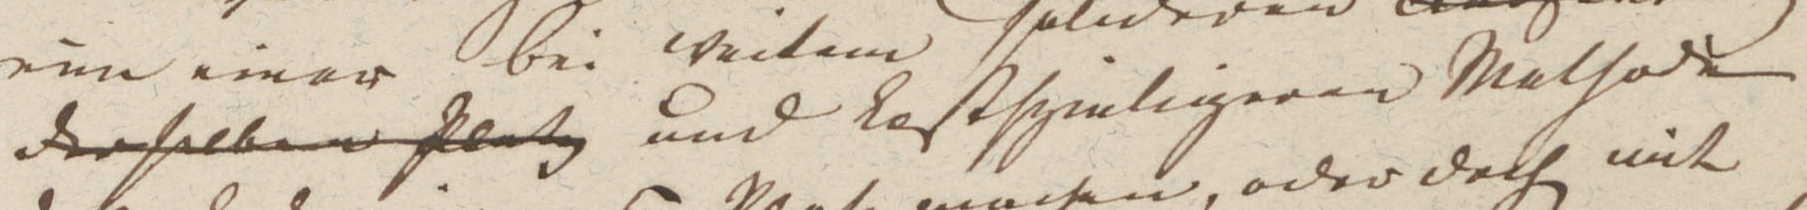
derselben Platz und kostspieligeren Methode
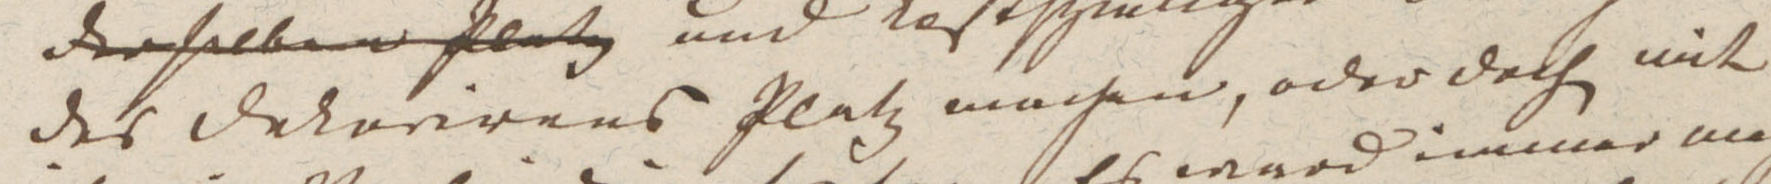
des Dekorirens Platz machen, oder doch mit
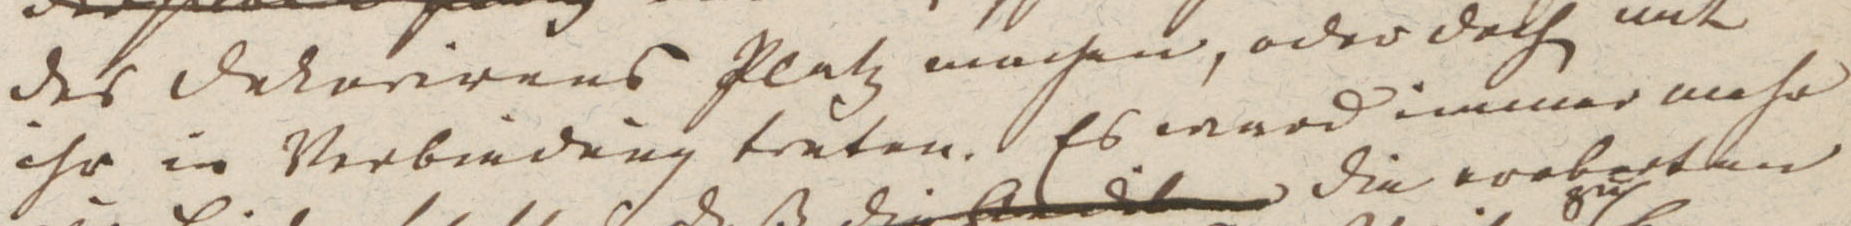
ihr in Verbindung treten. Es ward immer mehr
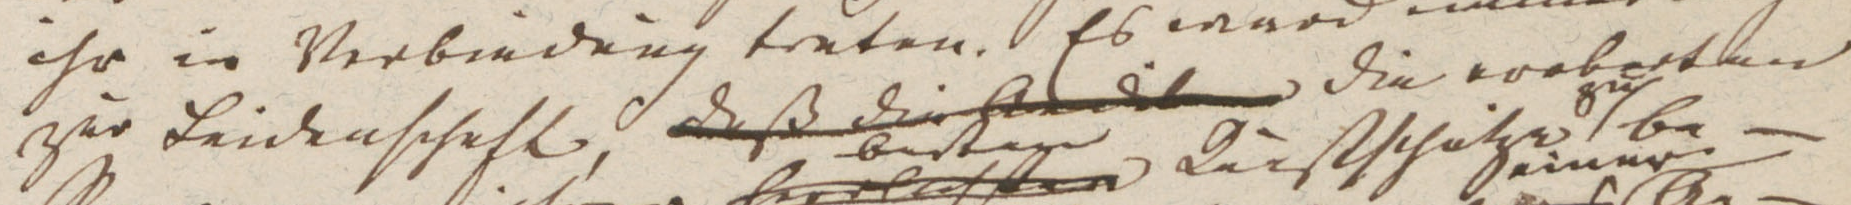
zur Leidenschaft, dass die die eroberten
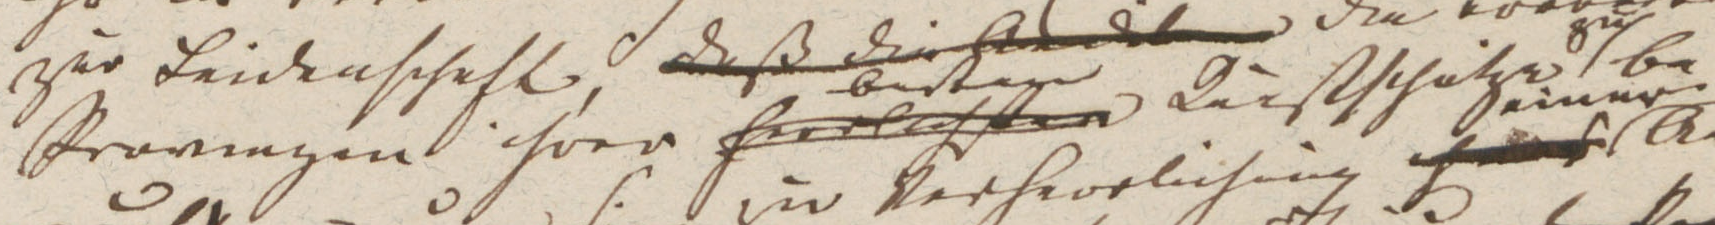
Provinzen ihrer herrlichsten besten Kunstschätze zu be-
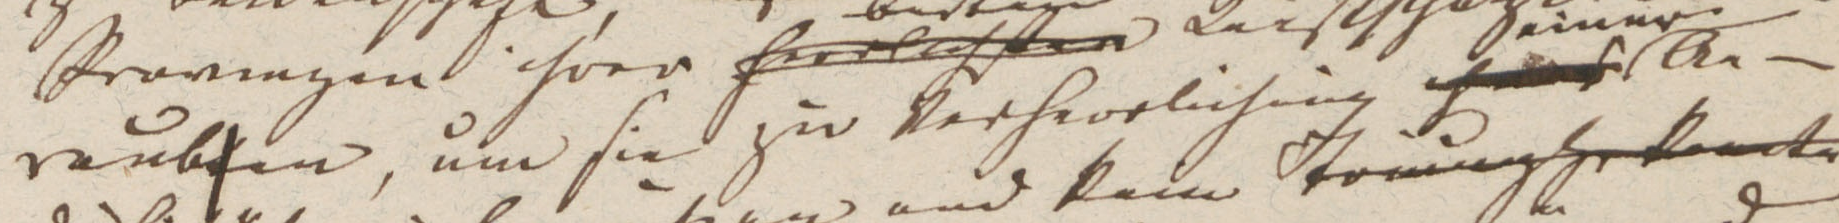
raubten, um sie zu Verherrlichung ihres einer Ae-
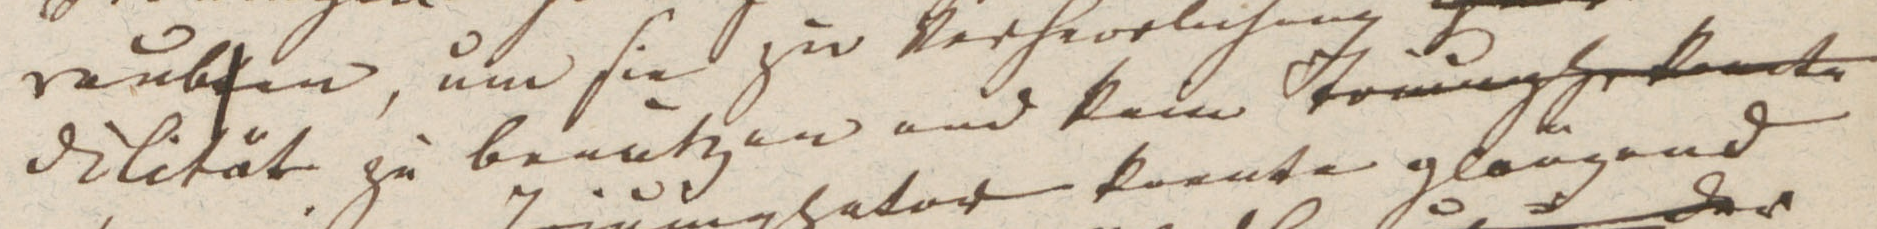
dilität zu bentzen und kein Triumph konnte
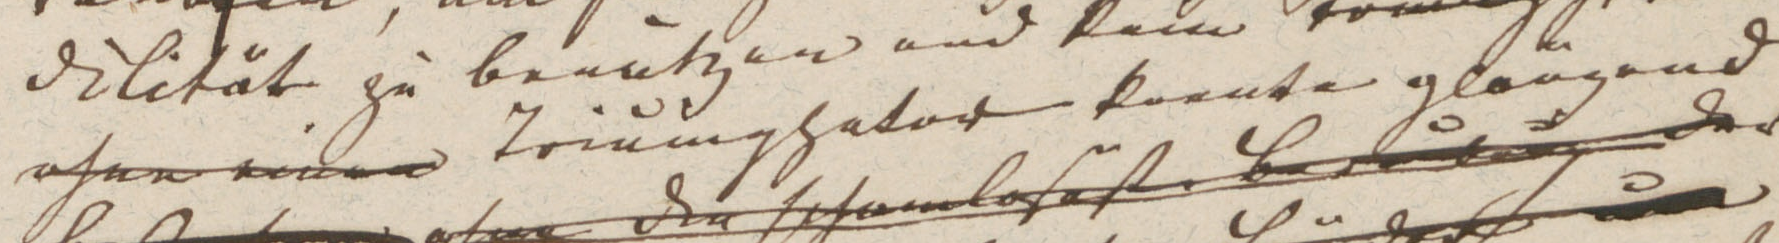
ohne einen Triumphator konnte glänzend
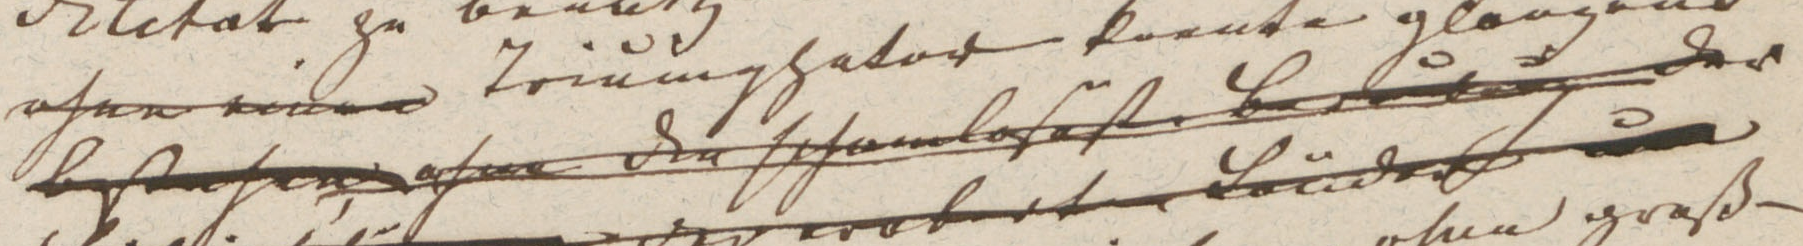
bestehen, ohne die schamloseste Beraubung der
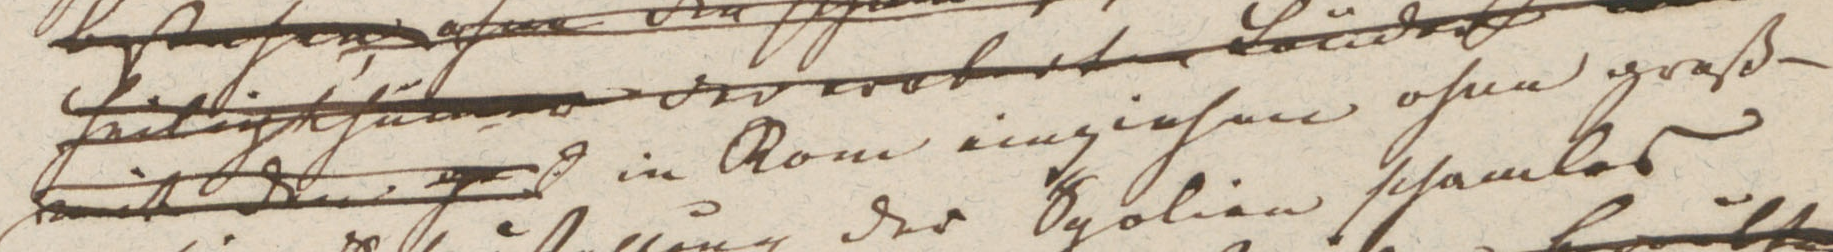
mit den ge S in Rom einziehen ohne gross-
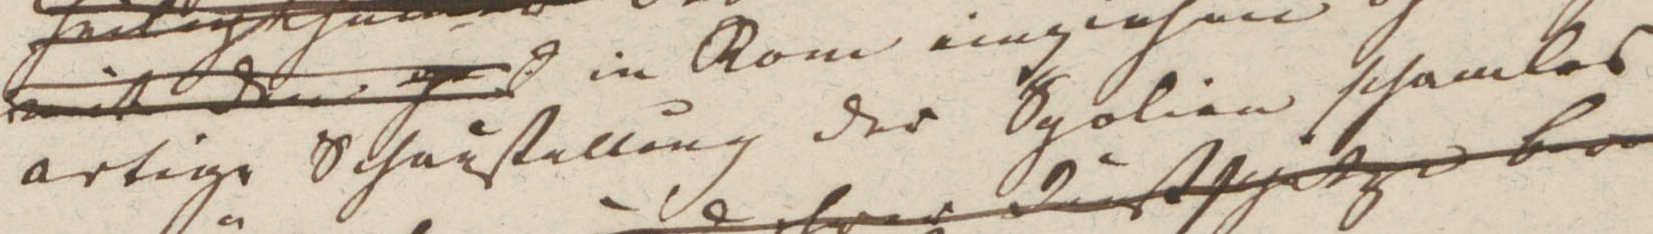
artige Schaustellung der Spolien schamlos
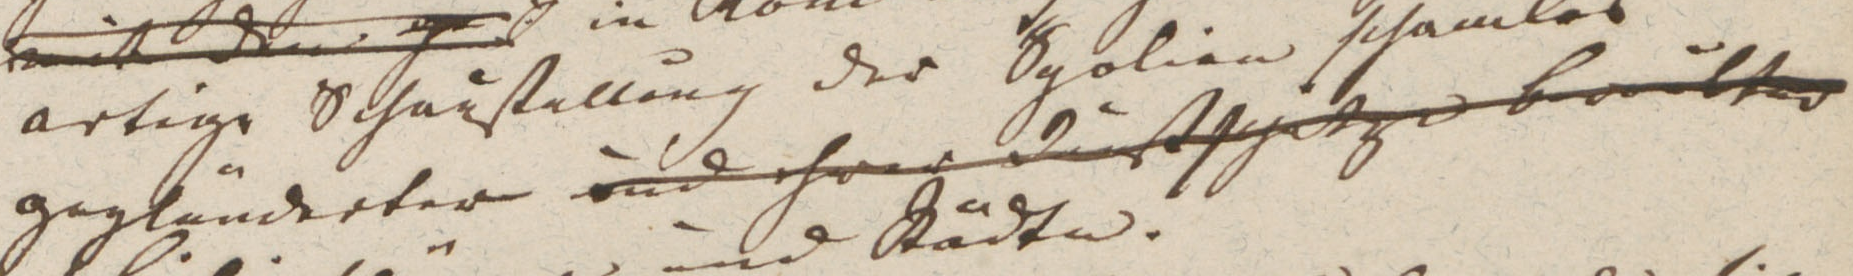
geplünderter und ihrer Kunstschätze beraubter
